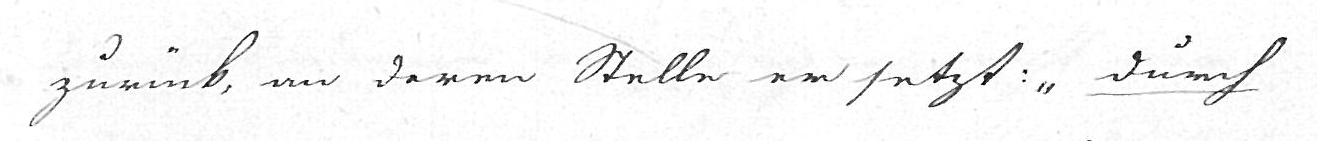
zurück, an deren Stelle er setzt: "durch
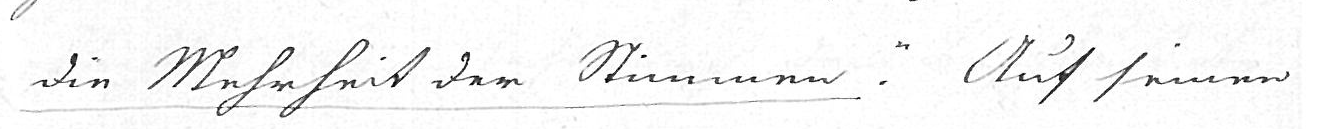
die Mehrheit der Stimmen." Auf seinen
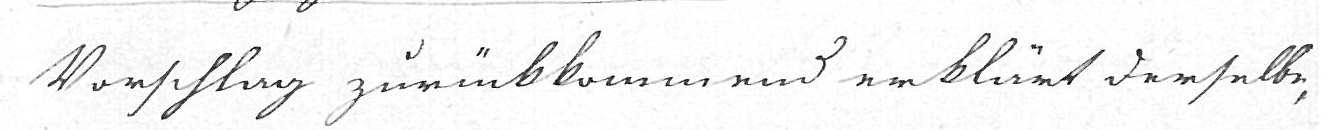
Vorschlag zurückkommend erklärt derselbe,
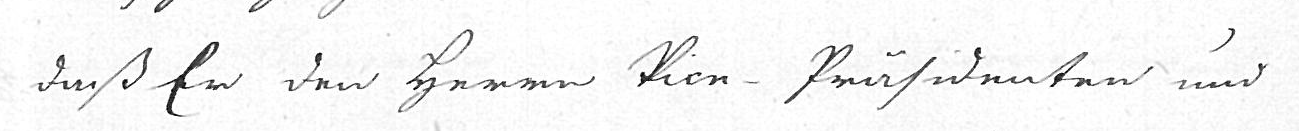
daß Er den Herrn Vice-Präsidenten und
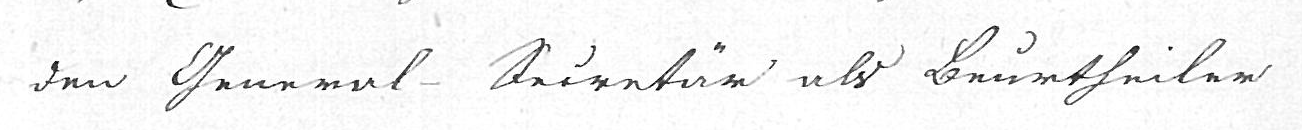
den General-Secretär als Beurtheiler
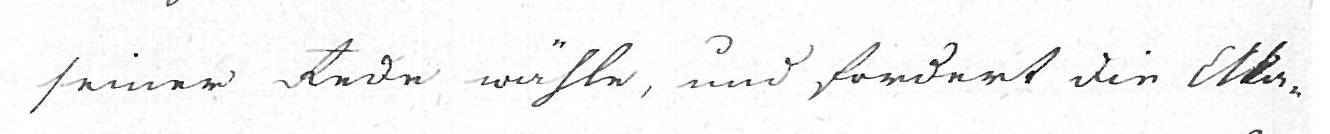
seiner Rede wähle, und fordert die Aka-
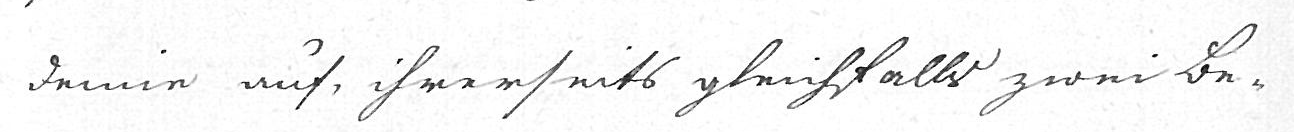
demie auf, ihrerseits gleichfalls zwei Be-
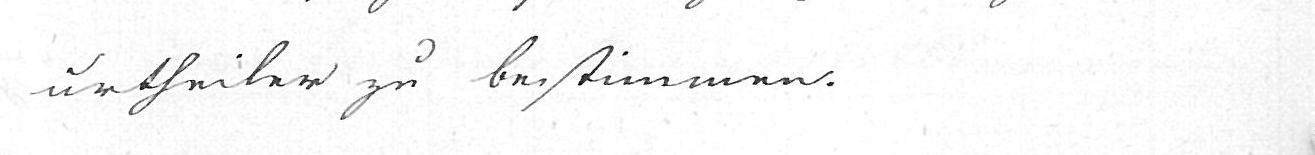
urtheiler zu bestimmen.
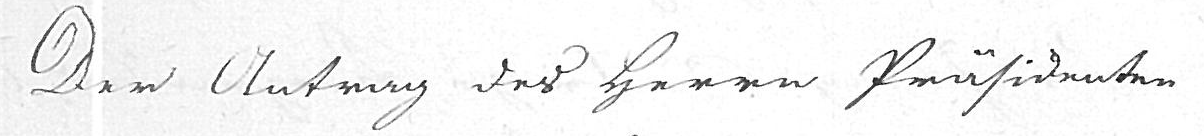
Der Antrag des Herrn Präsidenten
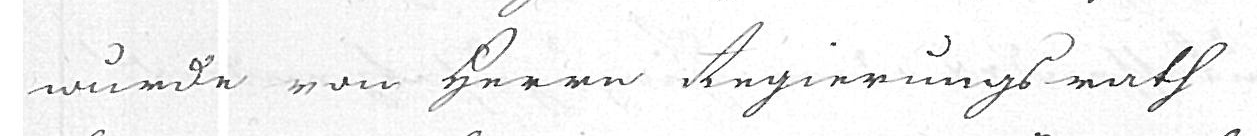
wurde von Herrn Regierungsrath
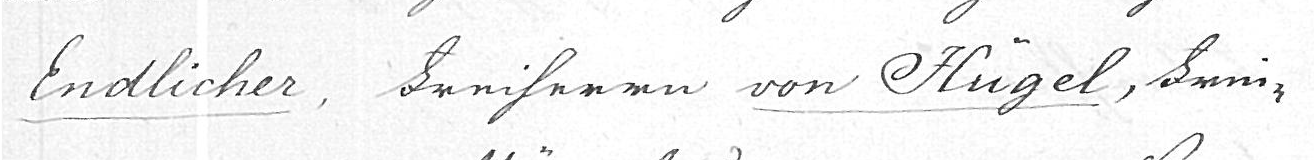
Endlicher, Freiherrn von Hügel, Frei-
